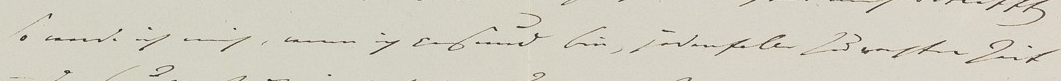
so werde ich mich, wenn ich gesund bin, jedenfalls zu rechter Zeit
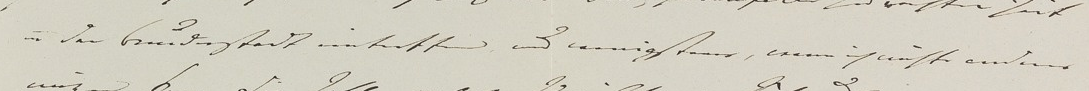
in der Bundesstadt eintreffen und wenigstens, wenn ich nichts anderes
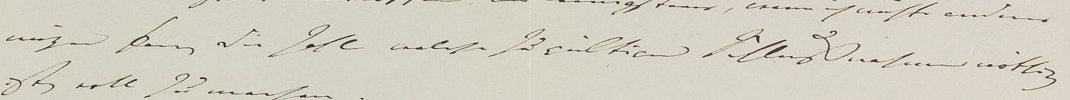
nüzen kann, die Zahl welche zu gültiger Schlußnahme nöthig
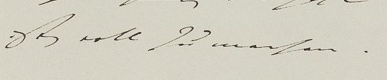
ist, voll zu machen.
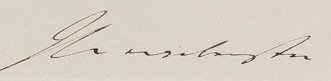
Ihr ergebenster
